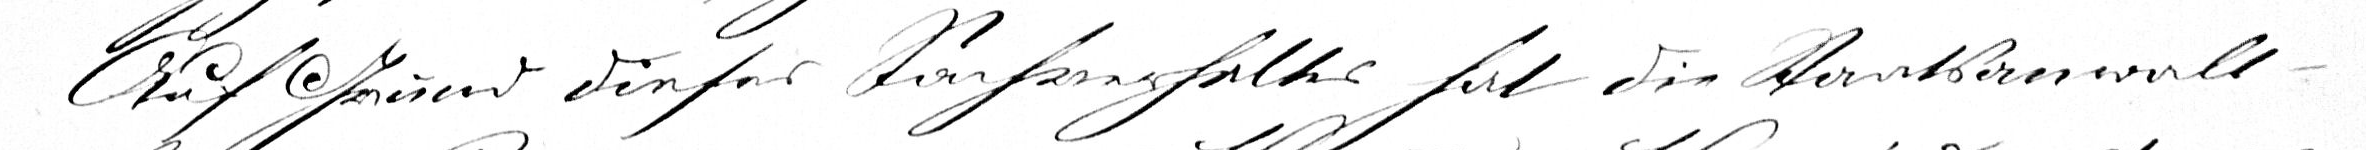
Auf Grund dieses Sachverhaltes hat die Staatsanwaltschaft
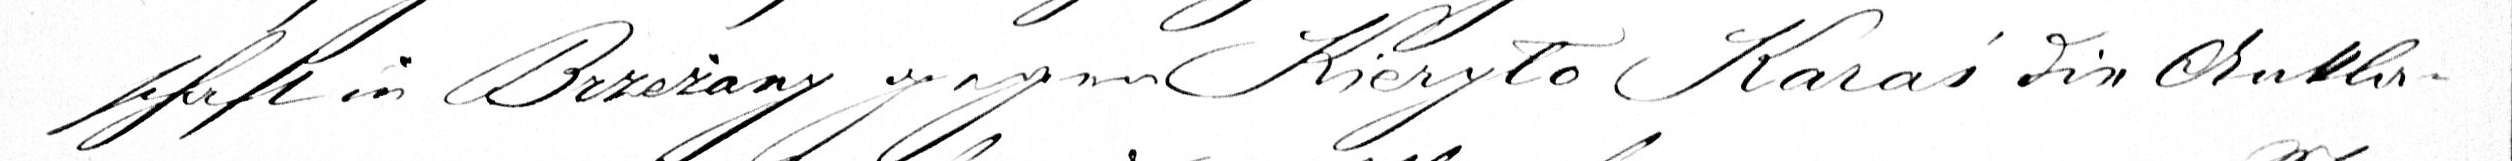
in Brzeżany gegen KierytoKaraś die Ankla¬
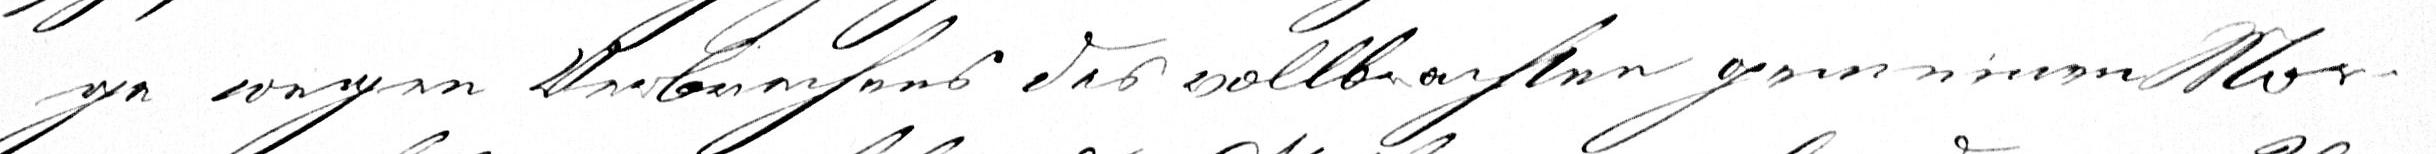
ge wegen Verbrechens des vollbrachten gemeinen Mor¬
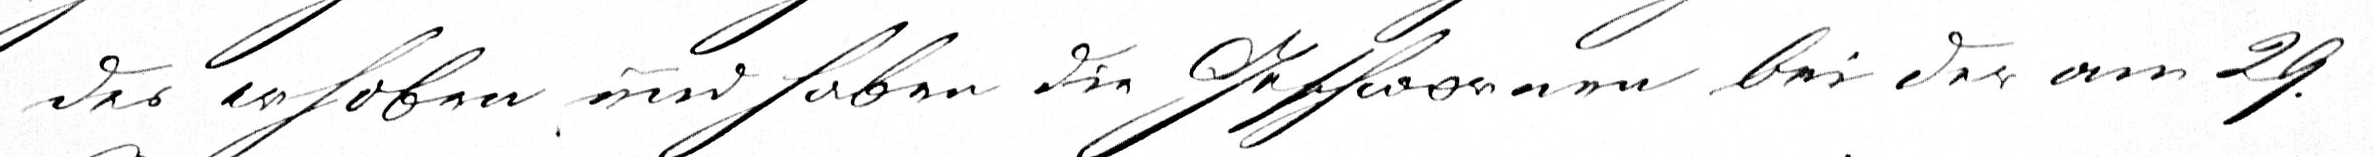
des erhoben und haben die Geschwornen bei der am 29.
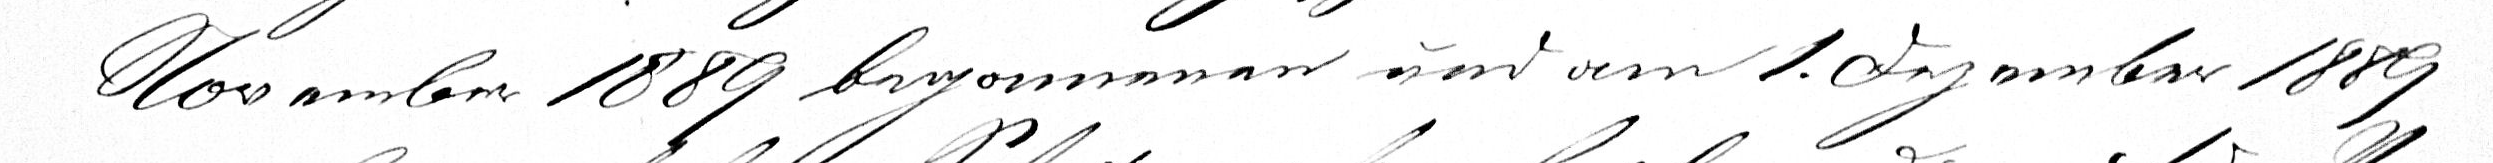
November 1889 begonnenen und am 1. Dezember 1889
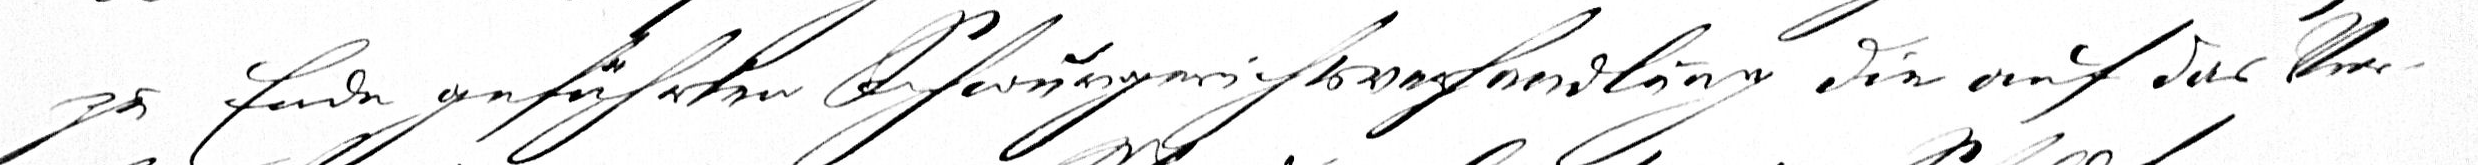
zu Ende geführten Schwurgerichtsverhandlung die auf das Ver¬
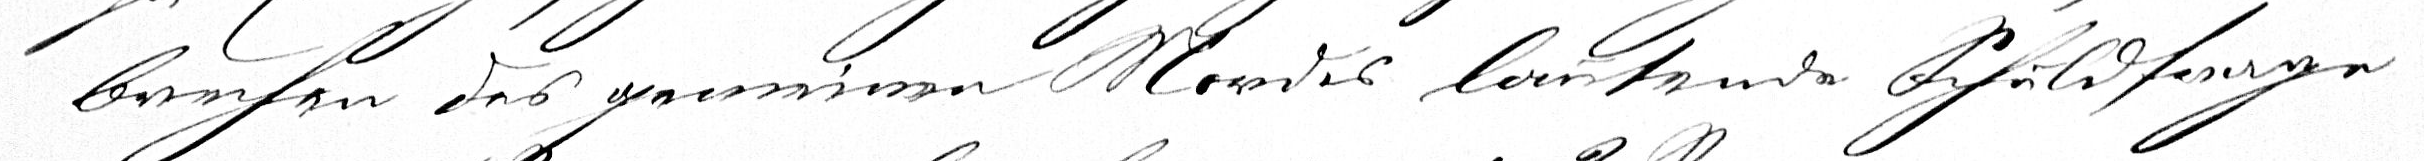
brechen des gemeinen Mordes lautende Schuldfrage
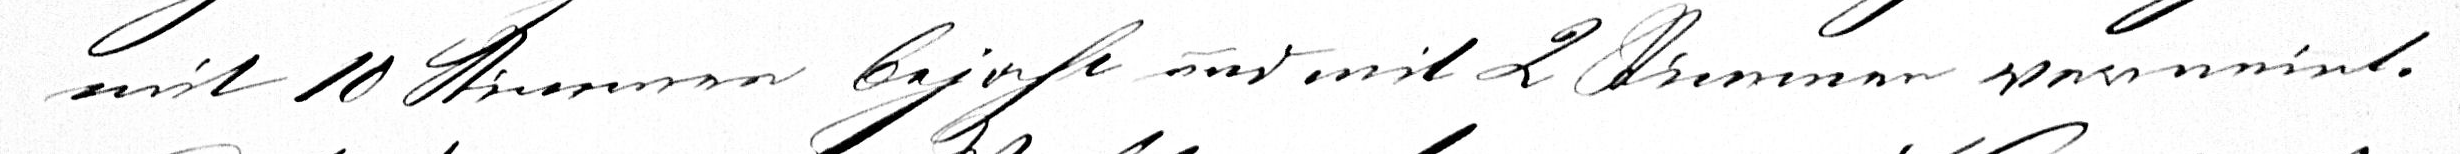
mit 10 Stimmen bejaht und mit 2 Stimmen verneint.
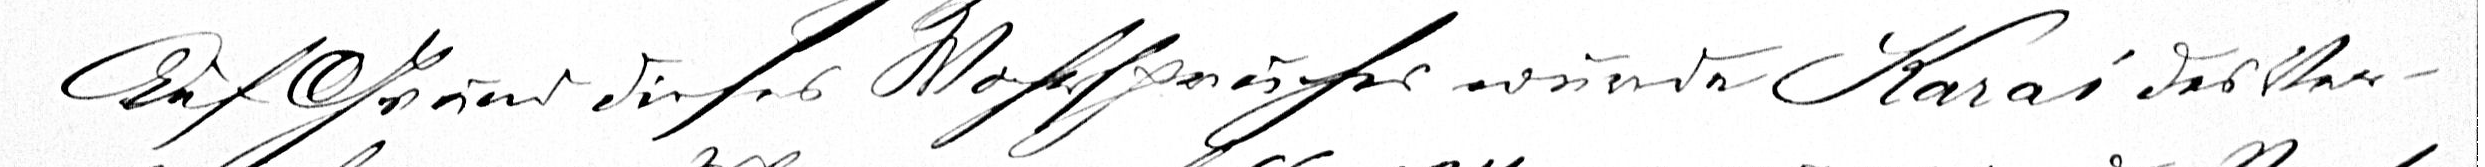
Auf Grund dieses Wahrspruches wurde Karaś des Ver¬
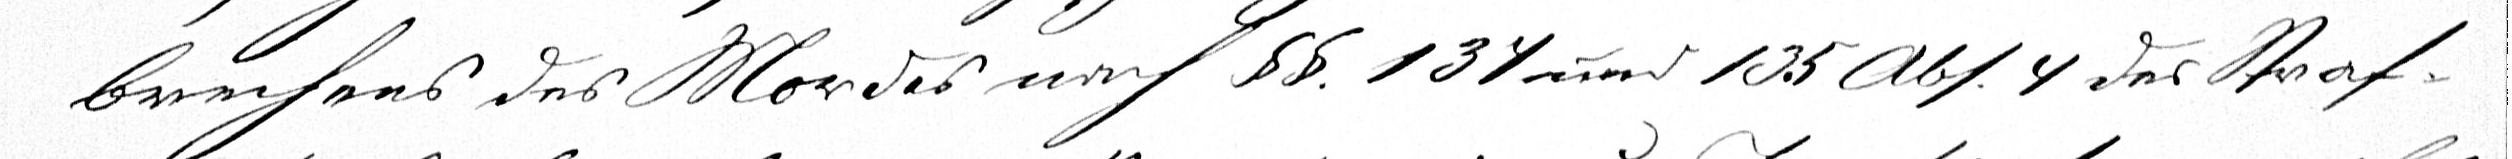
brechens des Mordes nach . §§. 134 und 135 Abs. 4 des Straf¬
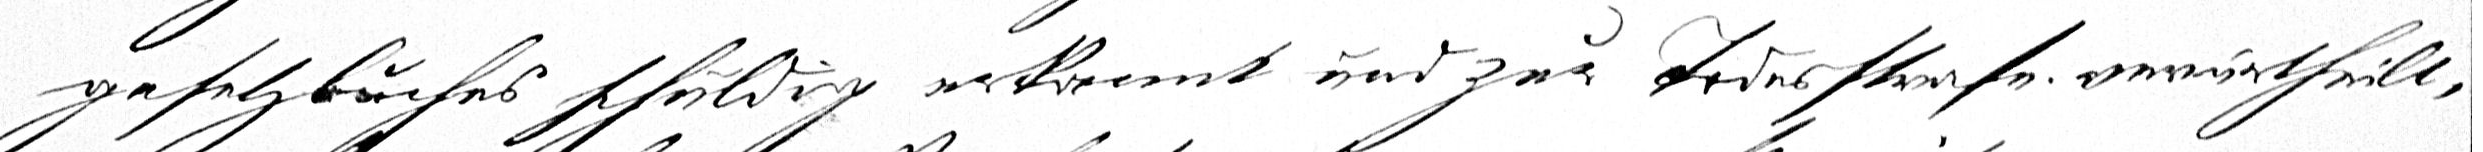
gesetzbuches schuldig erkannt und zur Todesstrafe,.verurtheilt,
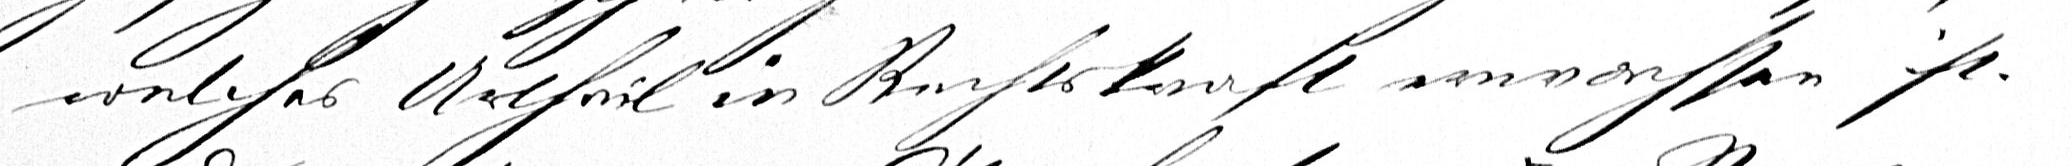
welches Urtheil in Rechtskraft erwachsen ist.
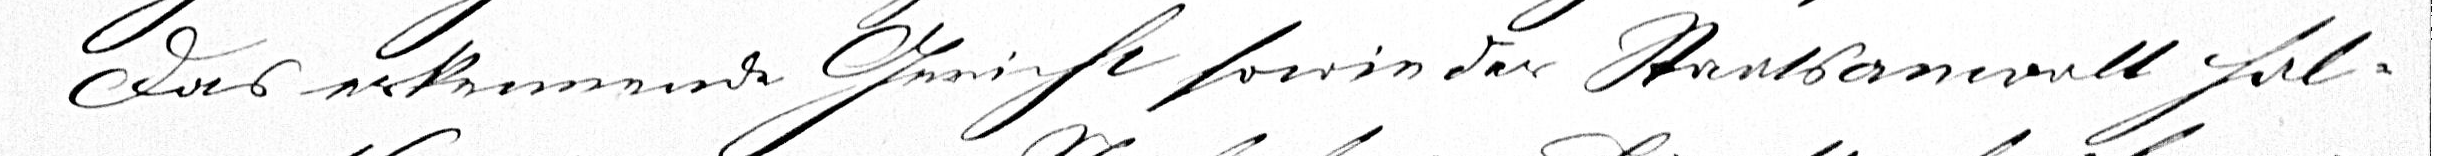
Das erkennende Gericht sowie der Staatsanwalt hal¬
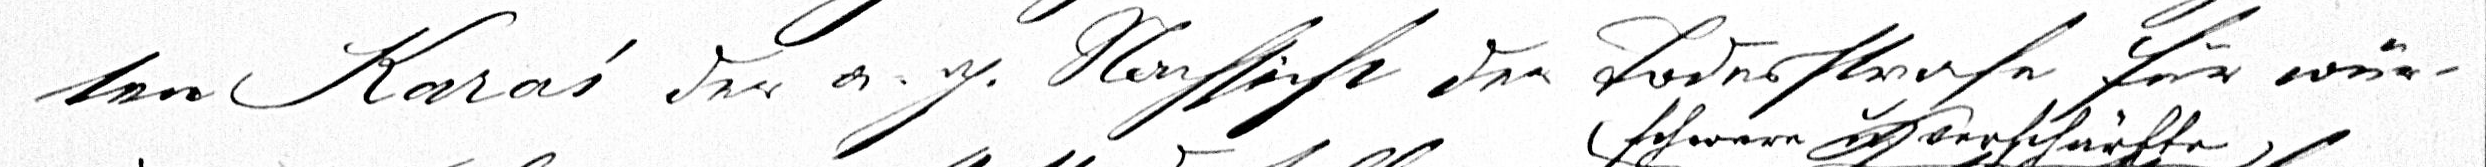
ten Karaś der a. g. Nachsicht der Todesstrafe für wür¬
